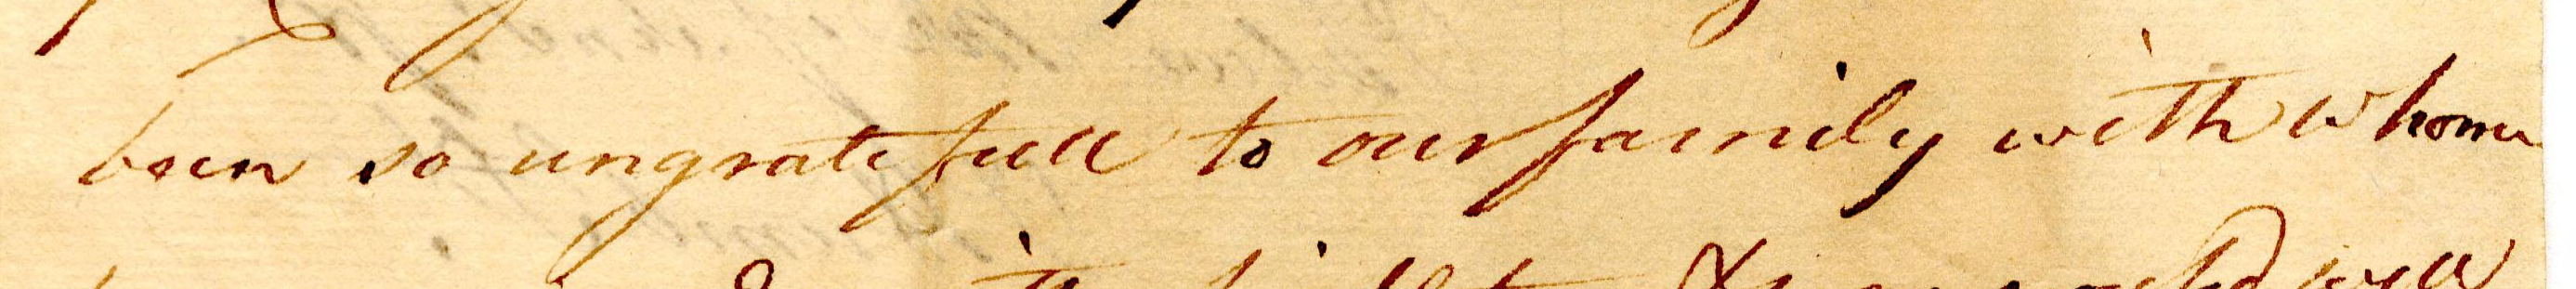been so ungratefull to our family with whom
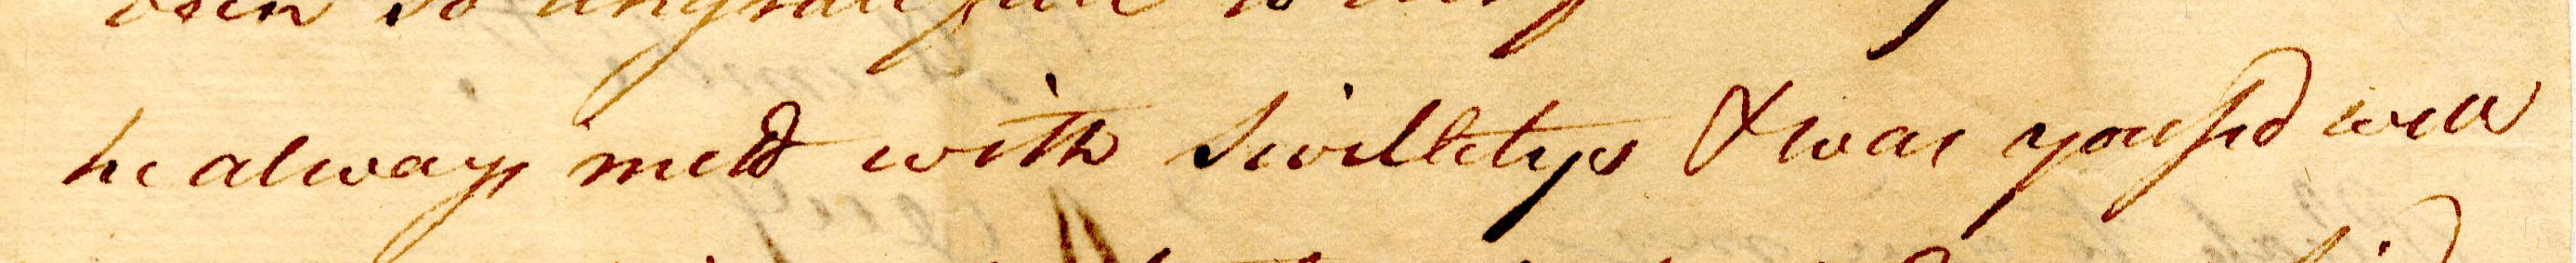he always metd with Sivilletys & was yoused well
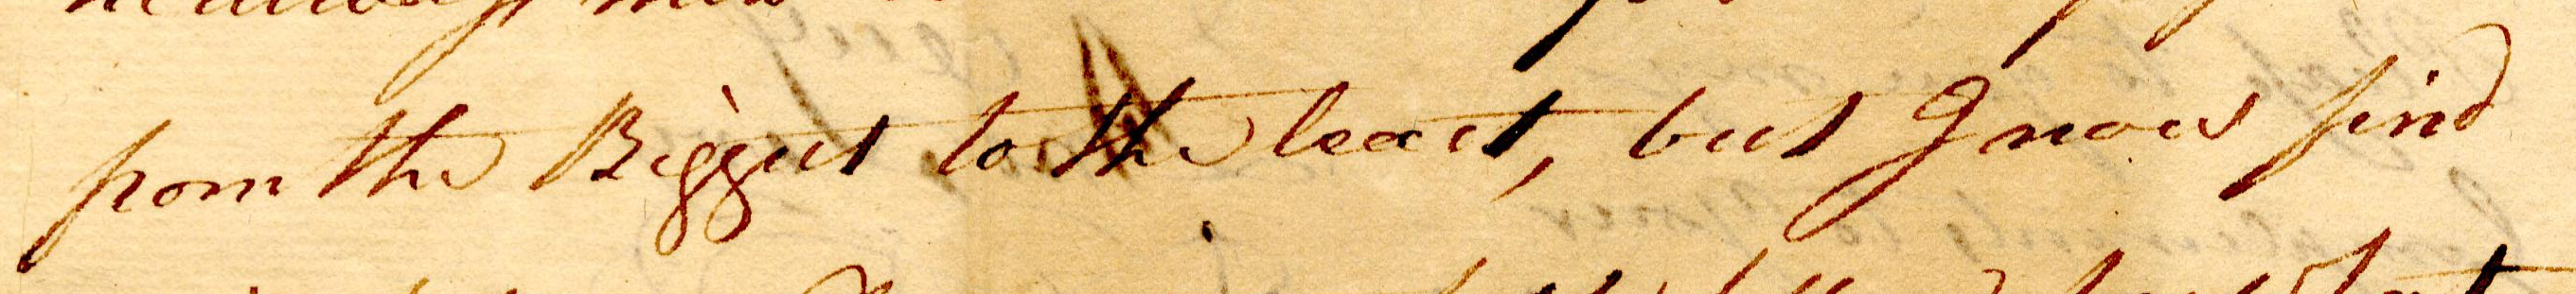fom the Biggest to the best, but I now find
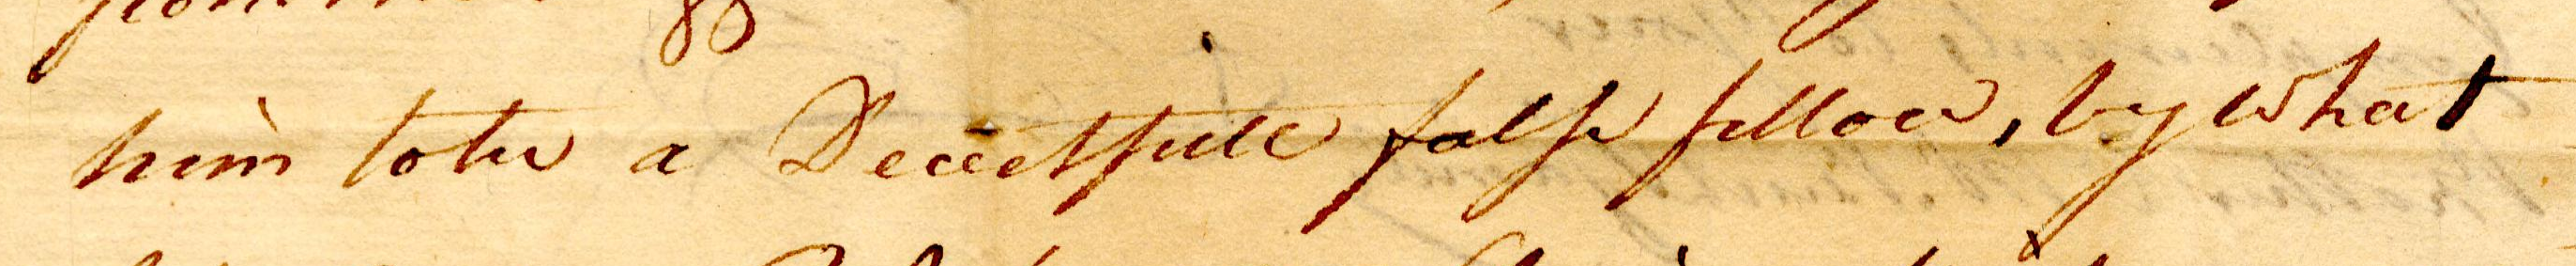him to be a Deceitfull false fellow, by what
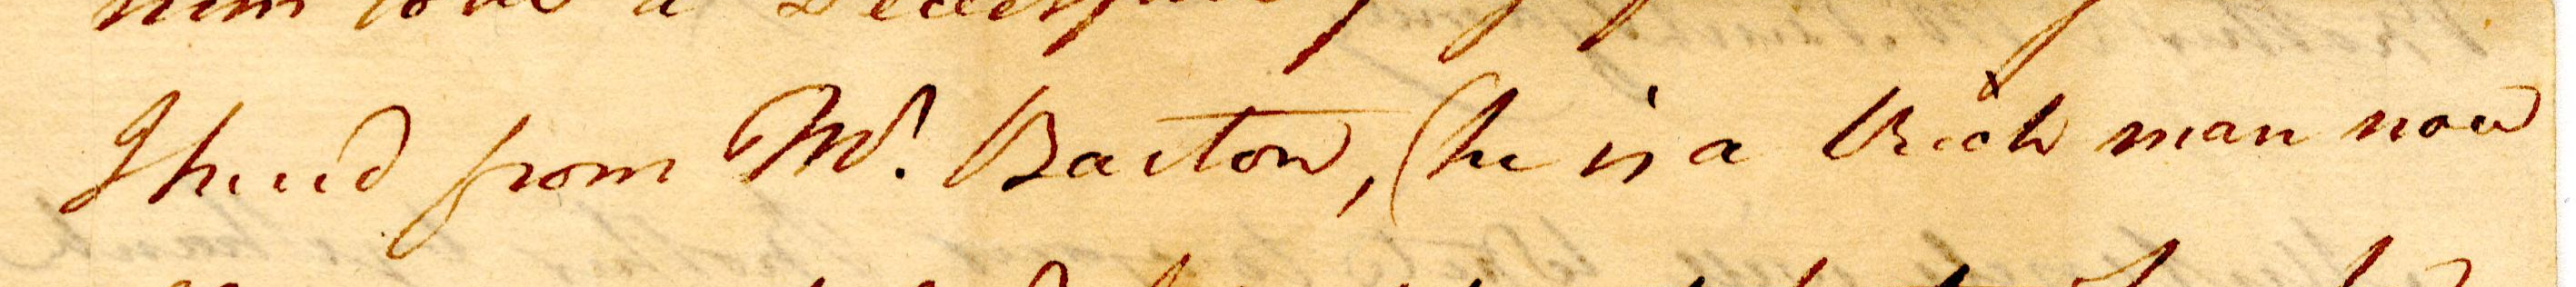I heard from M^r. Barton, (he is a Rich man now
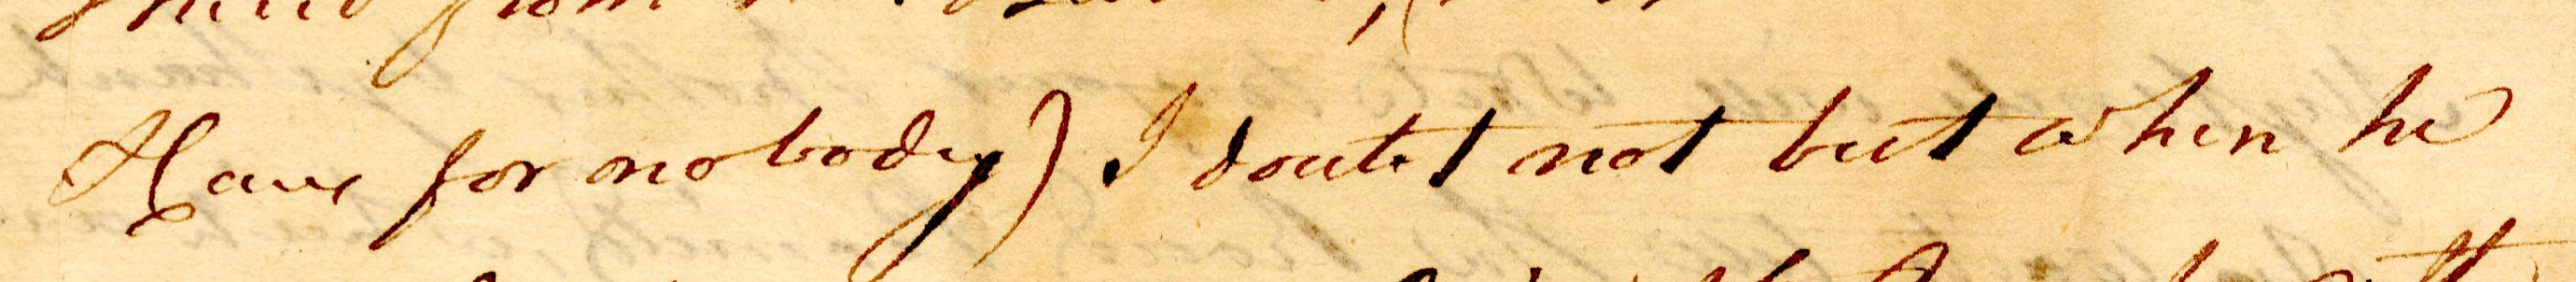a cause for nobody) I doubt not but when he
